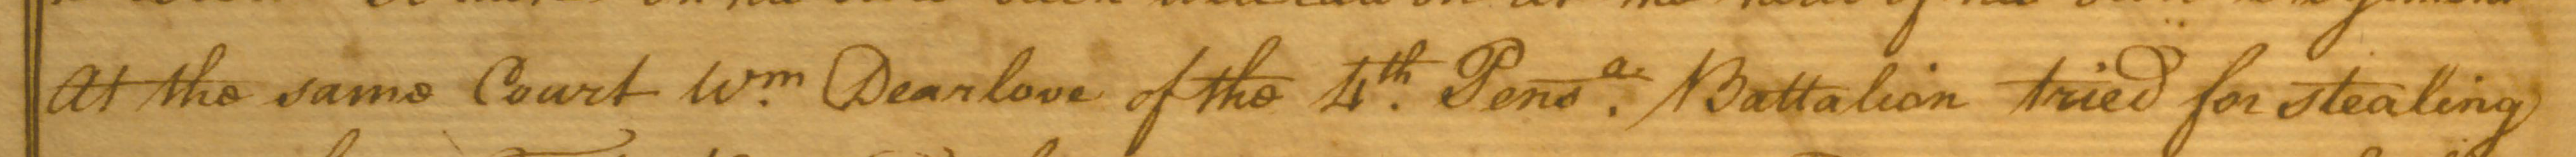At the same Court W^m. Dearlove of the 4^th. Pens^a. Battalion tried for stealing
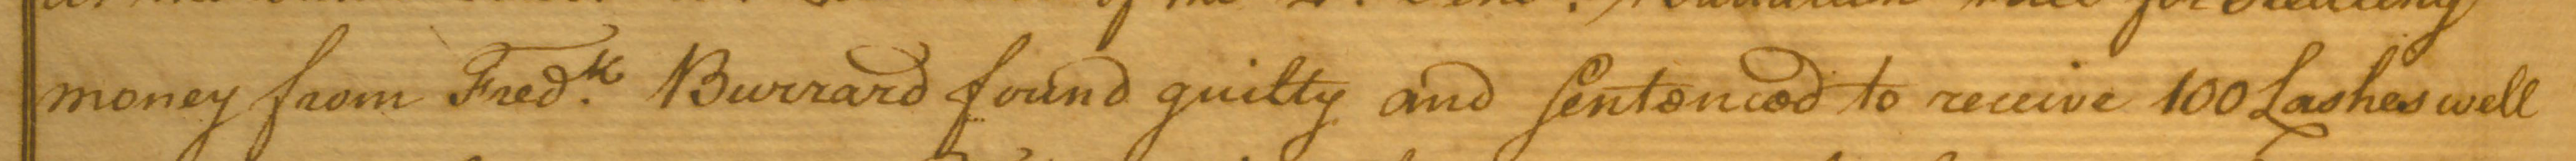money from Fred^k. Burrard found guilty and sentenced to receive 100 Lashes well
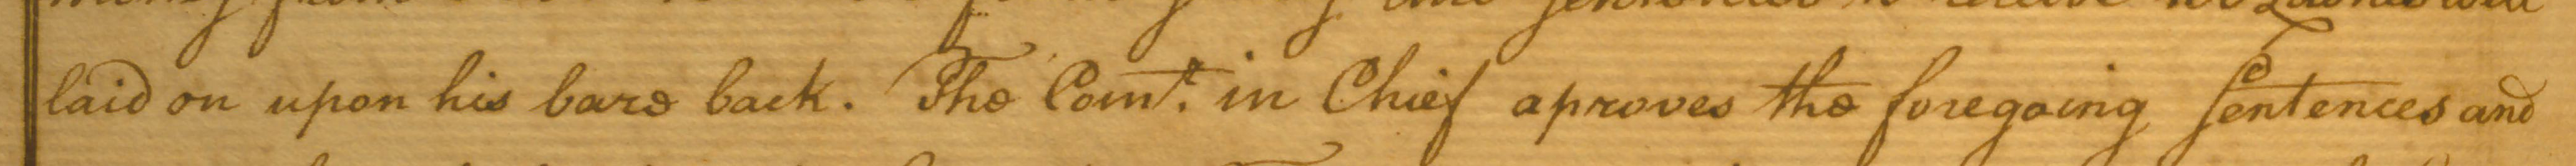laid on upon his bare back. The Com^r. in Chief aproves the foregoing sentences and
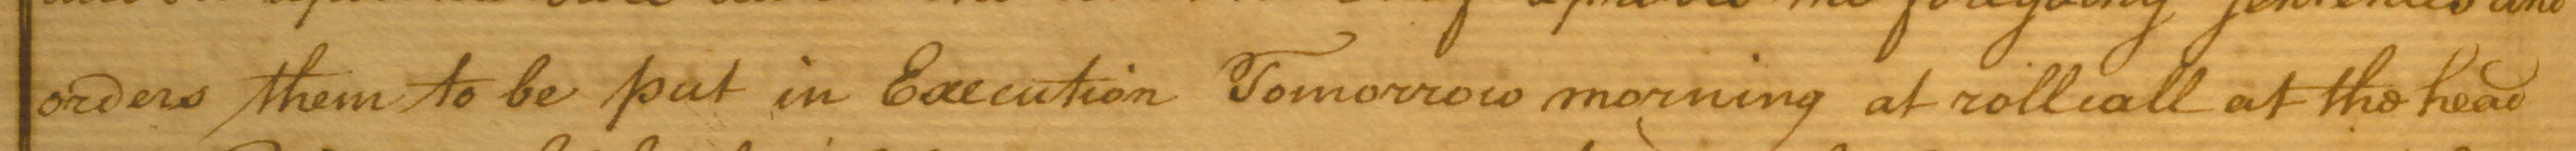orders them to be put in Execution Tomorrow morning at rollcall at the head
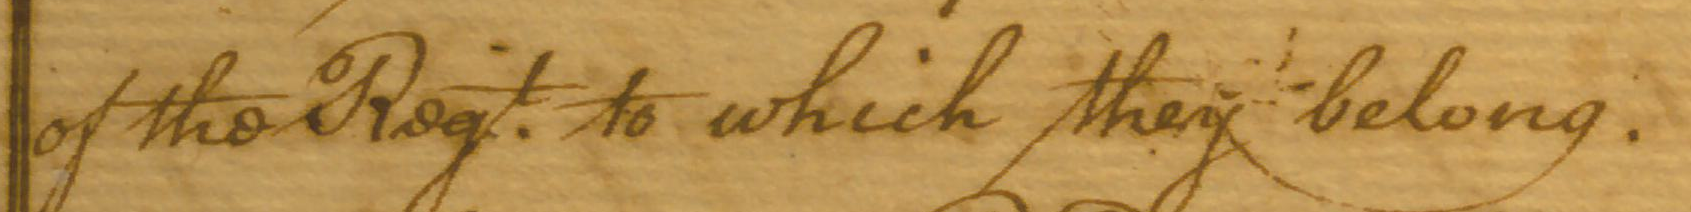of the Reg^t. to which they belong.
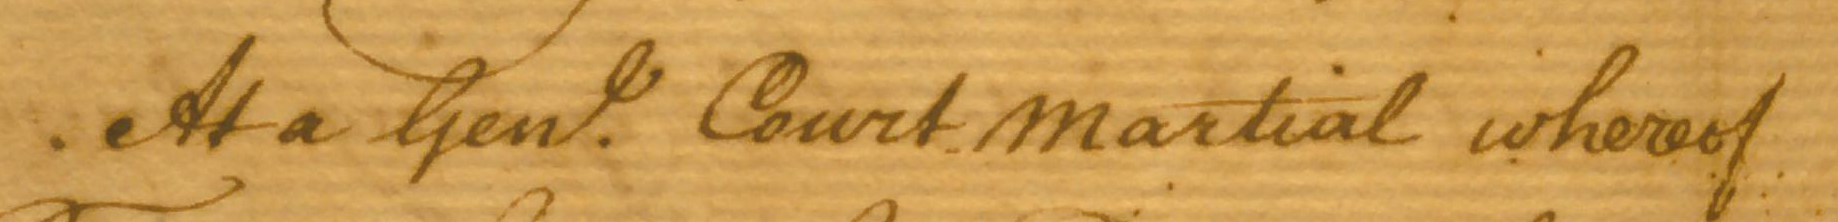At a Gen^l. Court martial whereof
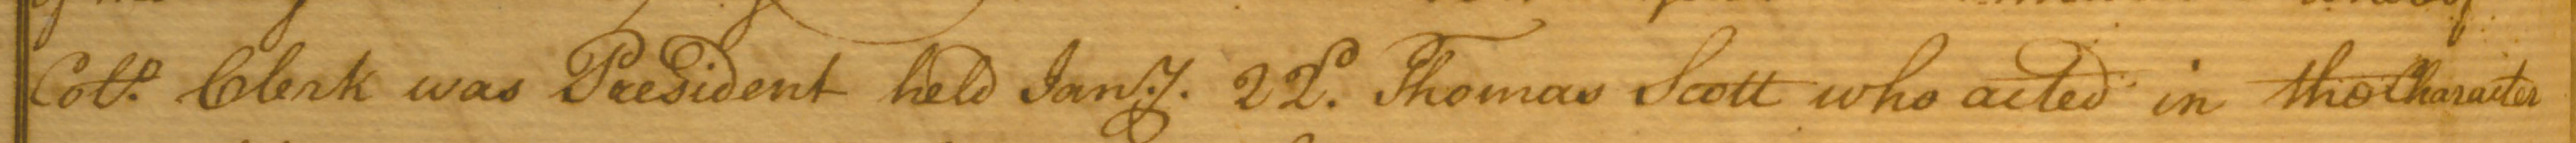Col^o. Clerk was President held Jan^y. 22^d. Thomas Scott who acted in Character
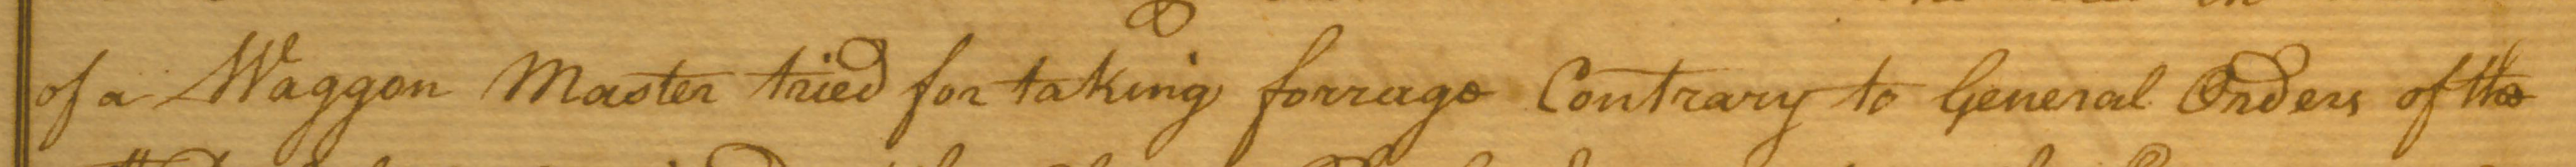of a Waggon Master tried for taking forrage Contrary to General Orders of the
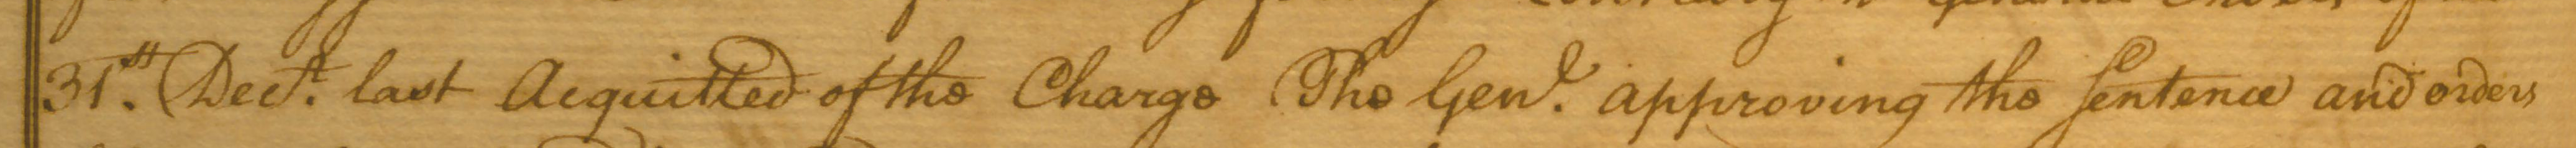31^st. Dec^r. last Acquitted of the Charge The Gen^l. approving the sentence and orders
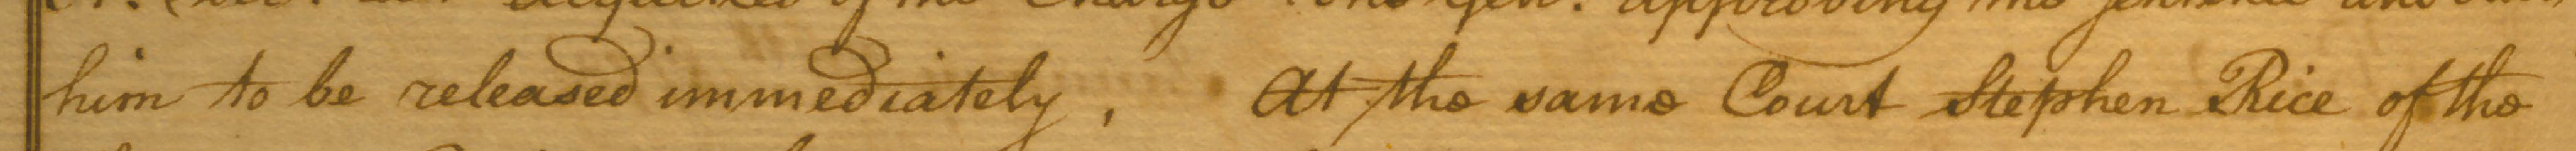him to be released immediately. At the same Court Stephen Rice of the
